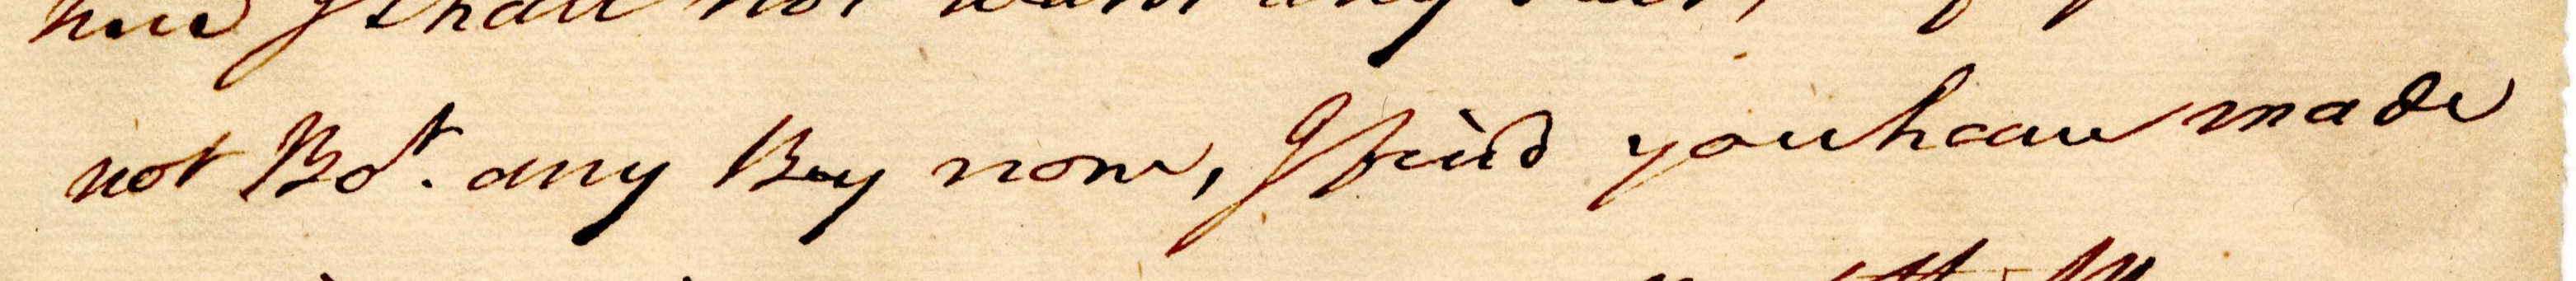not bo^t. any By now, I find you have made
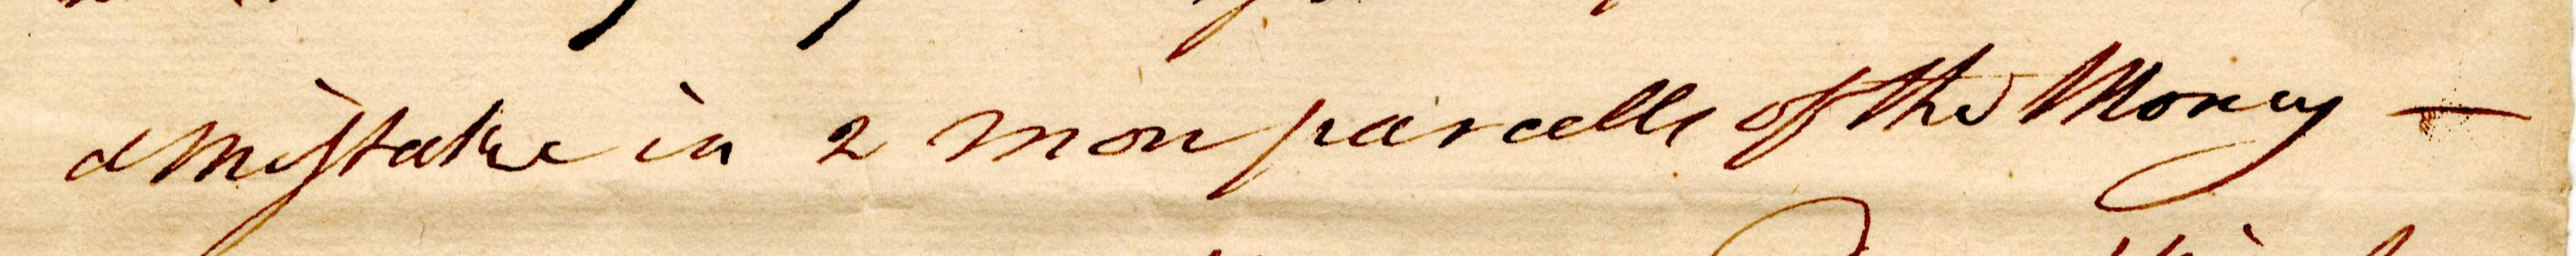a mistake in 2 more parcells of the Money.-
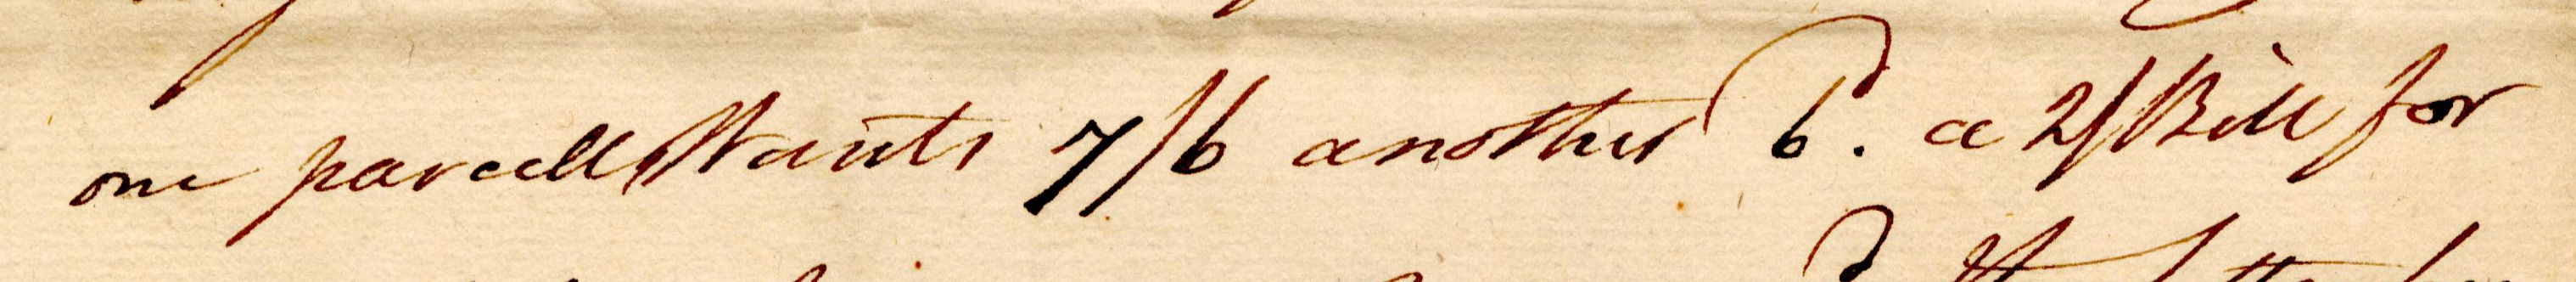one parcell Wants 7s6 another 6^d. cc 2s bill for
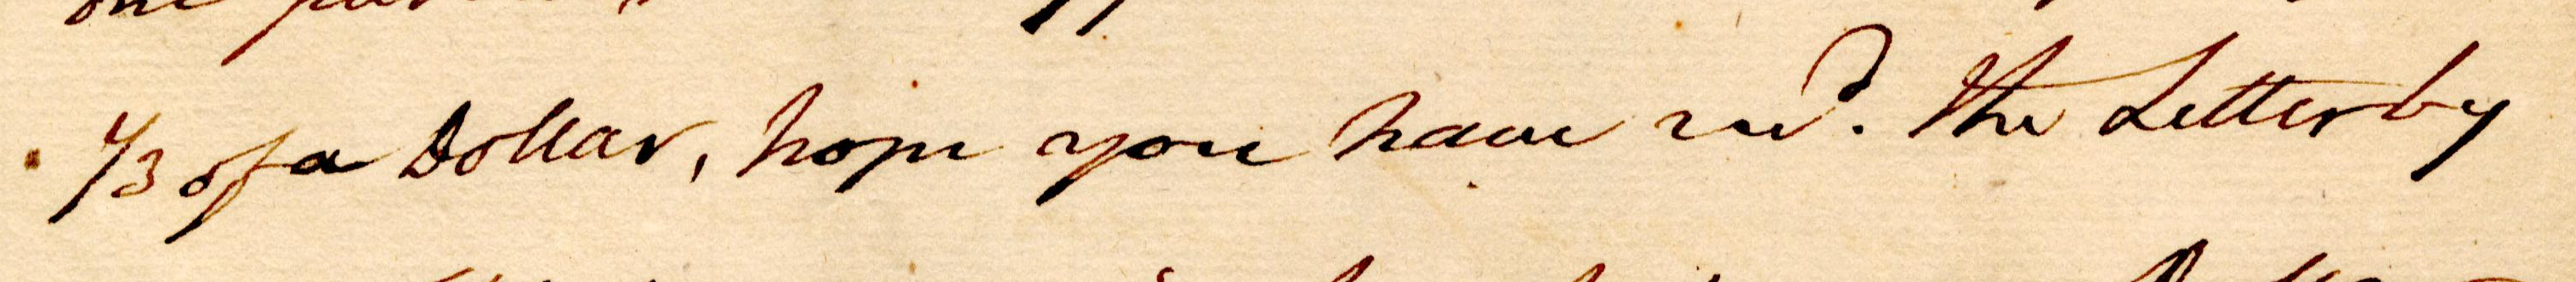1/3 of a Dollar, hope you have rec^d. the Letter by
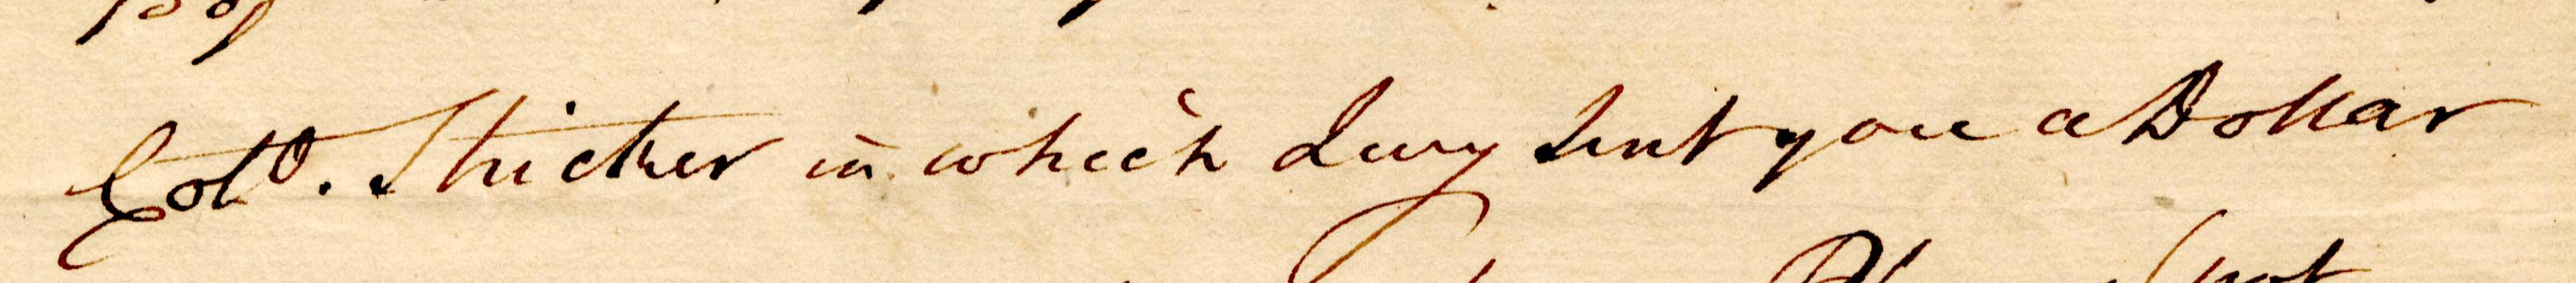Col^o. Shicker in which Lays sent you a Dollar
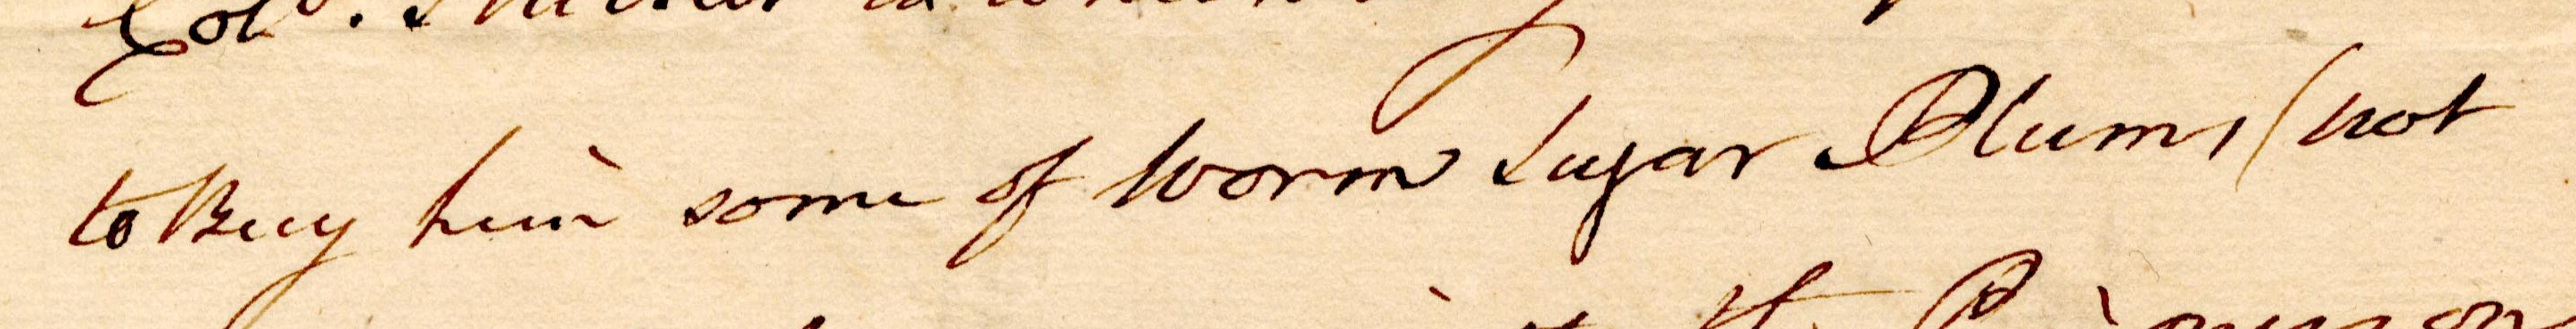to Buy him some of Worm Sugar Plums (not
